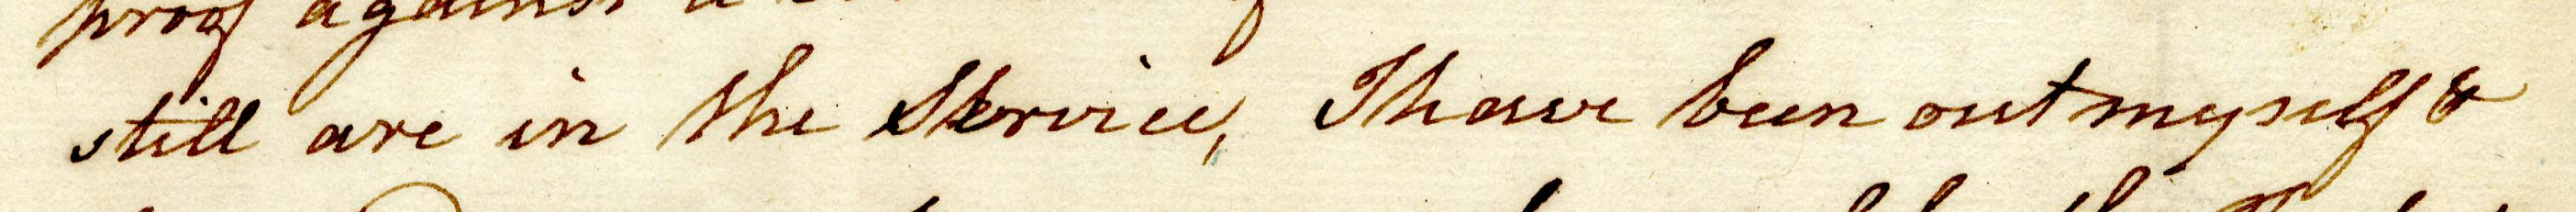still are in the Service, I have been out myself &
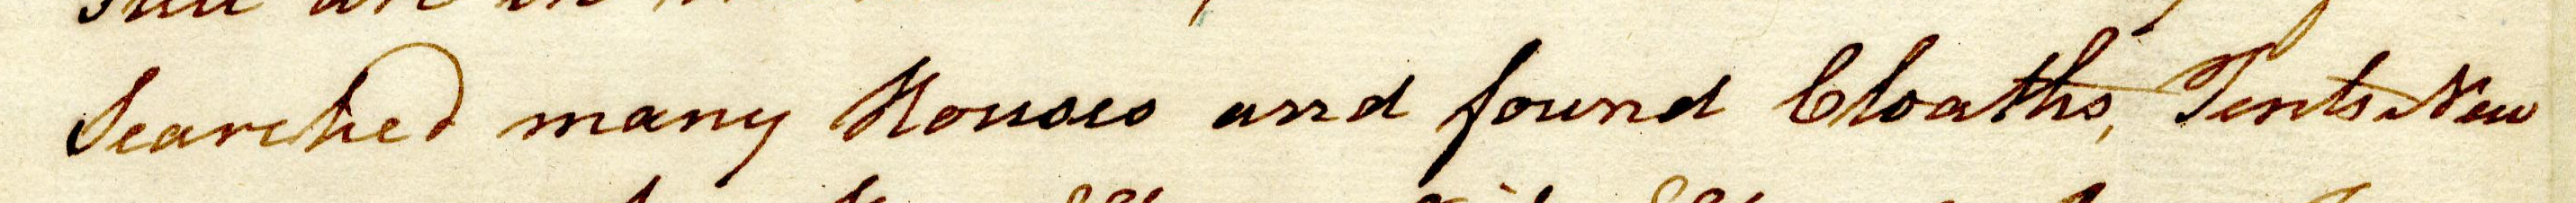Searched many Houses and found Cloaths, Tents new
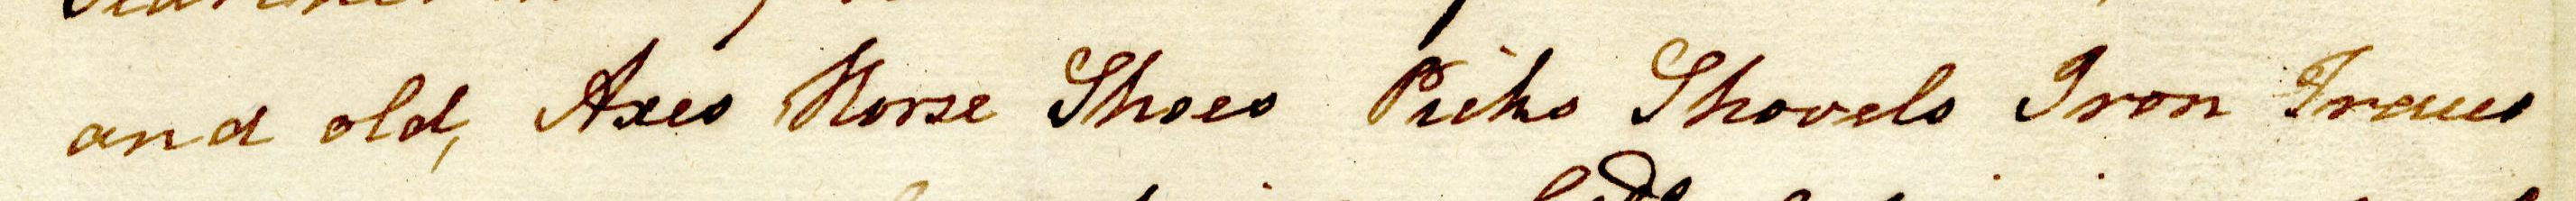and old, Axes Horse Shoes Picks Shovels Iron Troues
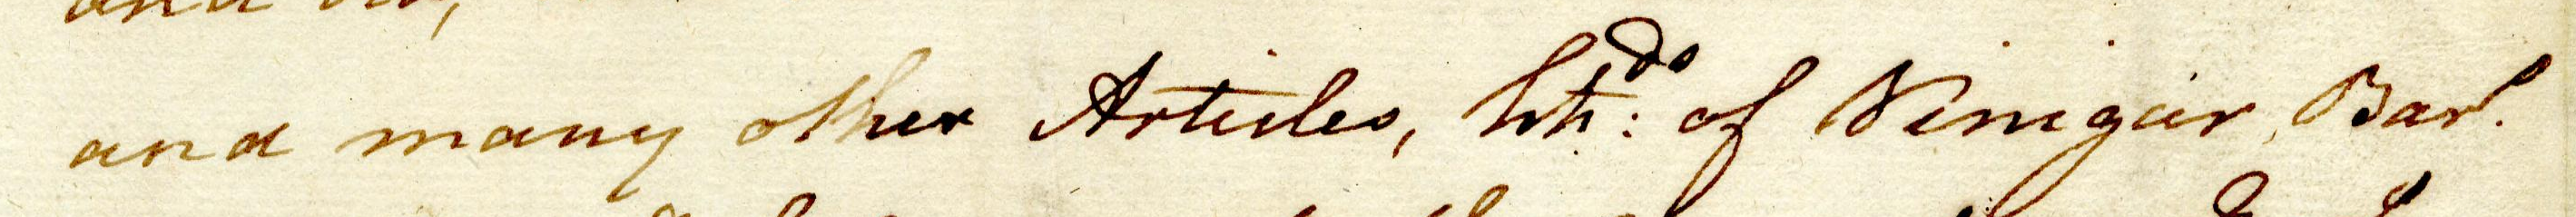and many other Articles, ht^ds: of Vinigar, Bar^l.
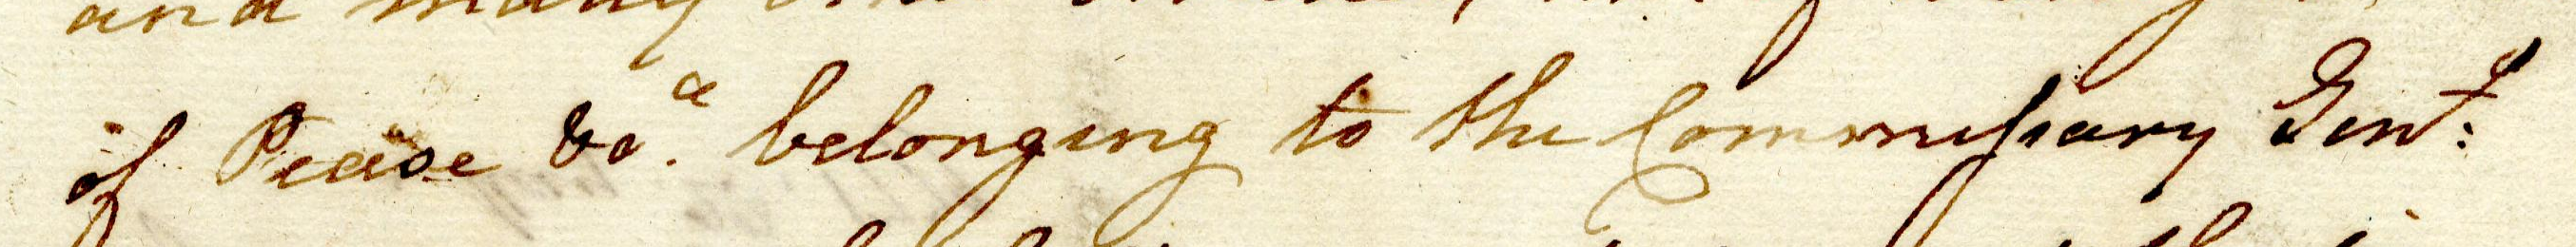of Pease &c^a. belonging to the Commissary Gen^ls:
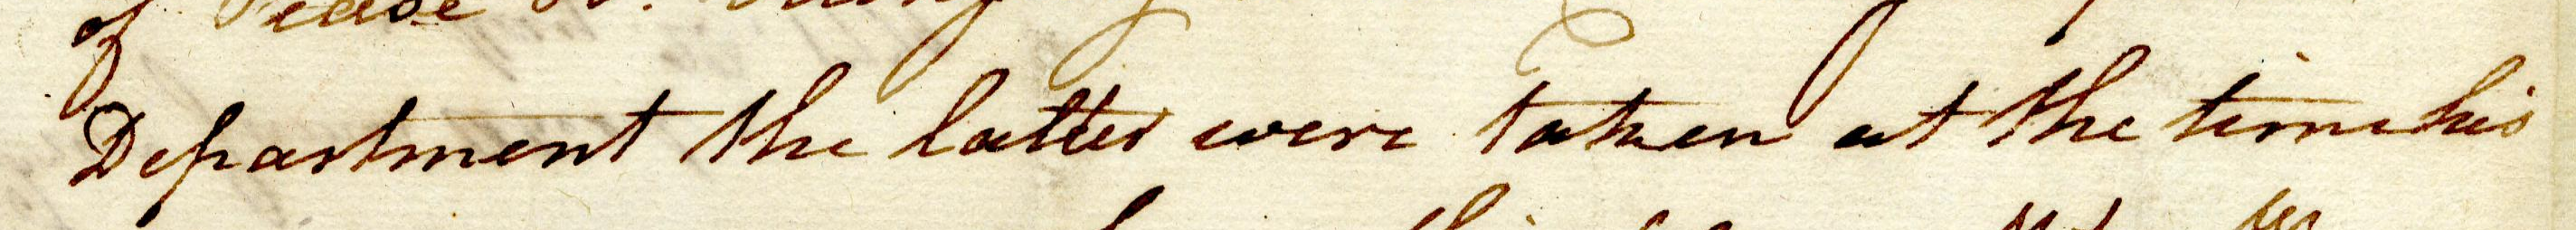Department the latter were taken at the time his
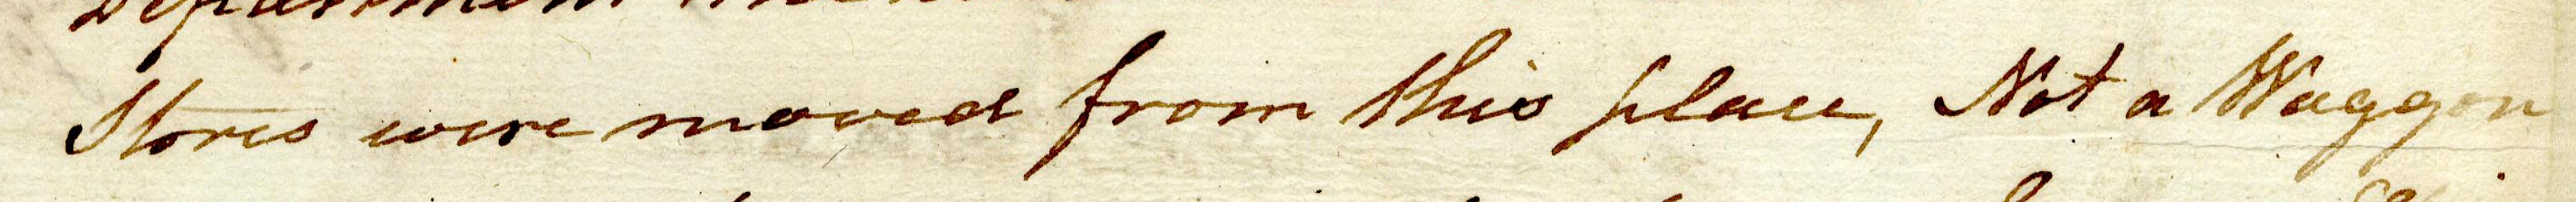Stores were moved from this place, Not a Waggon
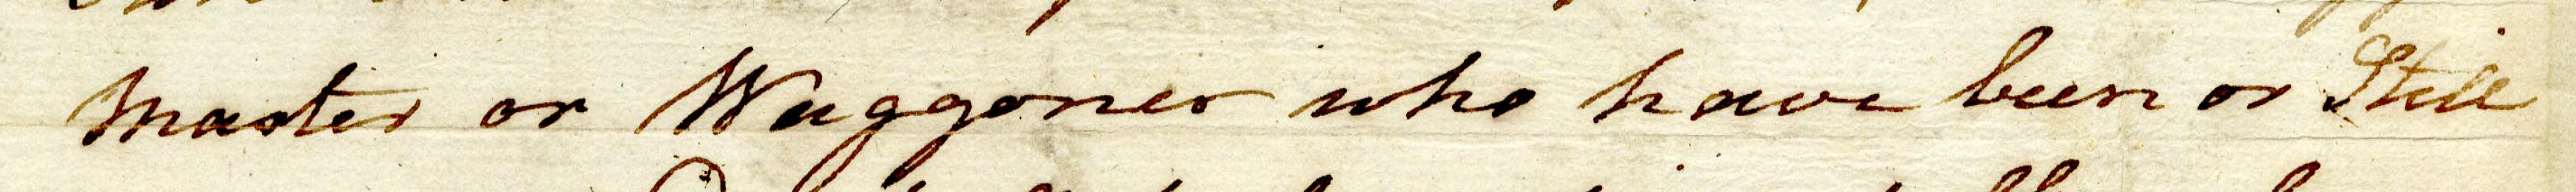Master or Waggoner who have been or still
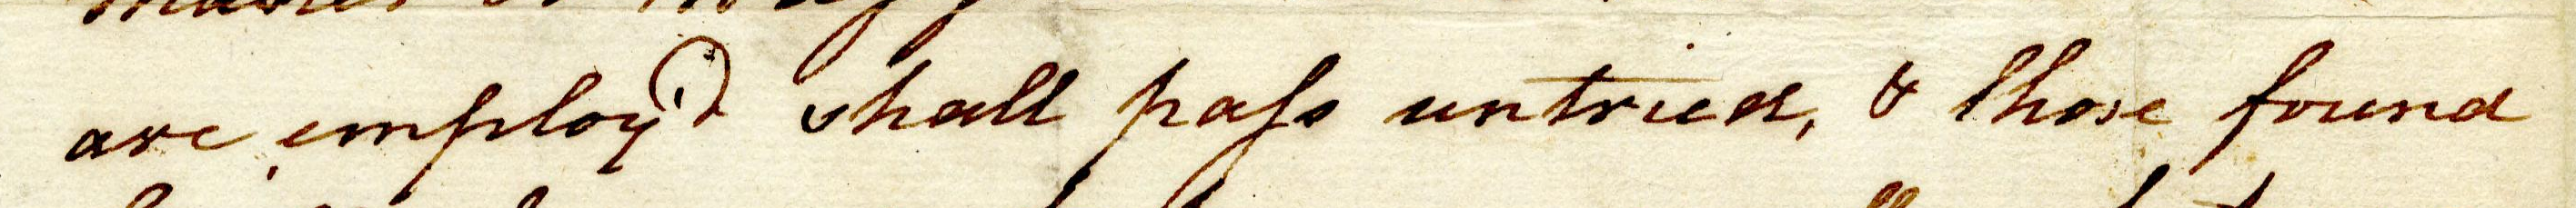are employ'd shall pass untried, & those found
